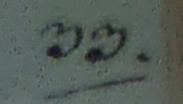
33.
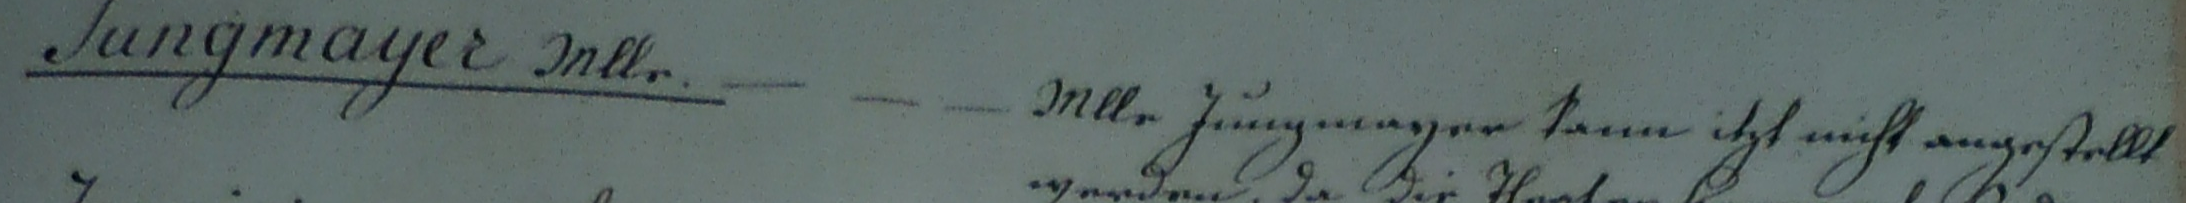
Jungmayer Mlle. _ _ _ Mlle Jungmayer kann itzt nicht angestellt
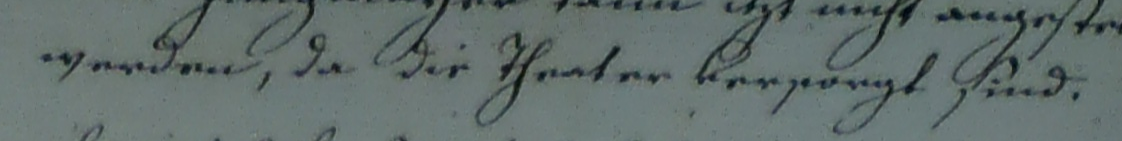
werden, da die Theater versorgt sind.
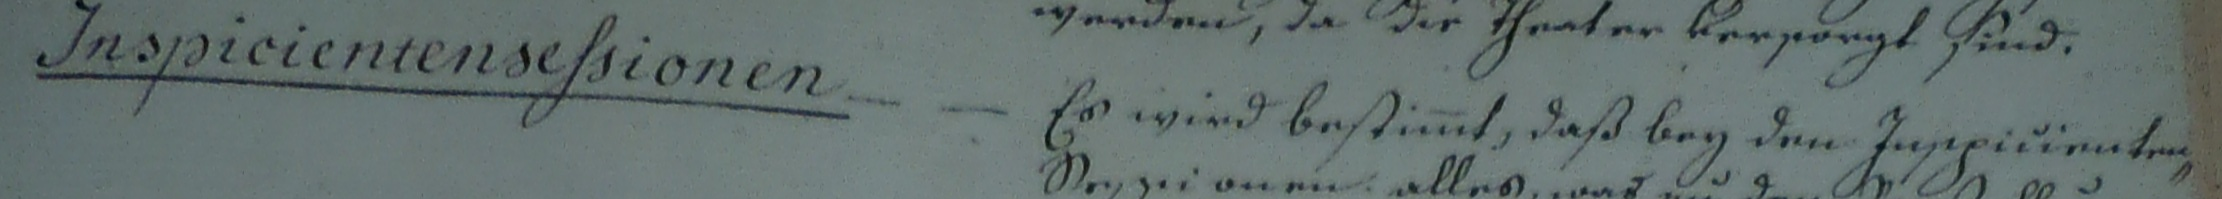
Inspicientensessionen _ _ Es wird bestim̅t, daß bey den Inspicienten¬
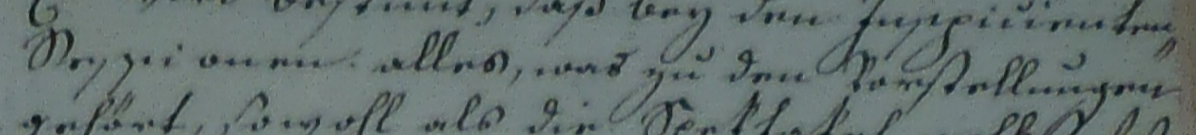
Sessionen alles, was zu den Vorstellungen
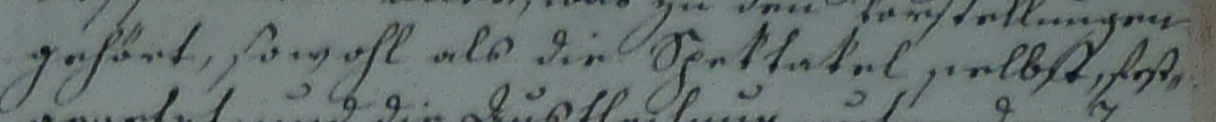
gehört, sowohl als die Spektakel selbst, fest¬
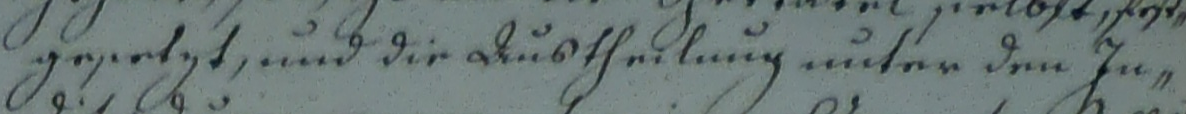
gesetzt, und die Austheilung unter den In¬
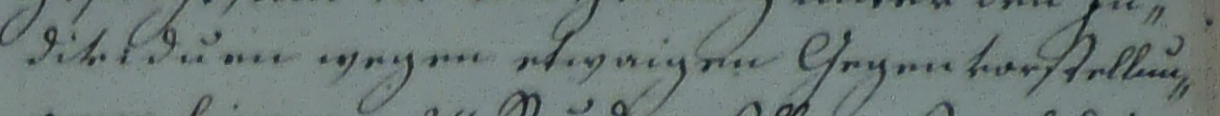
dividuen wegen etwaigen Gegenvorstellun¬
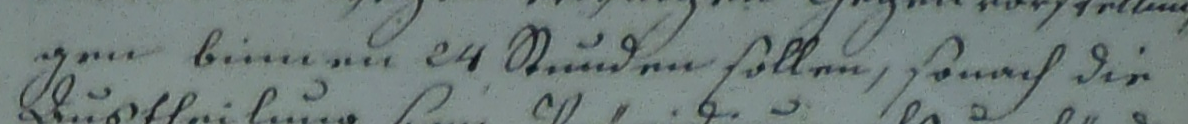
gen binnen 24 Stunden sollen, sonach die
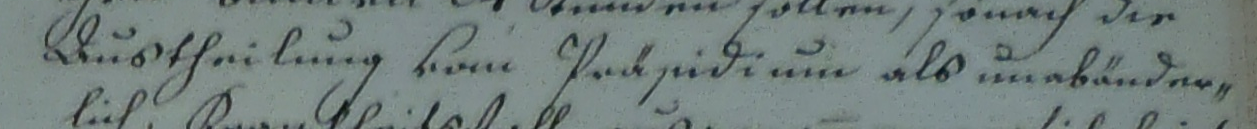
Austheilung vom Präsidium als unabänder¬
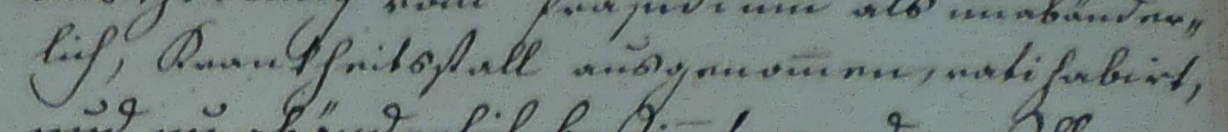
lich, Krankheitsfall ausgenom̅en, ratihabirt,
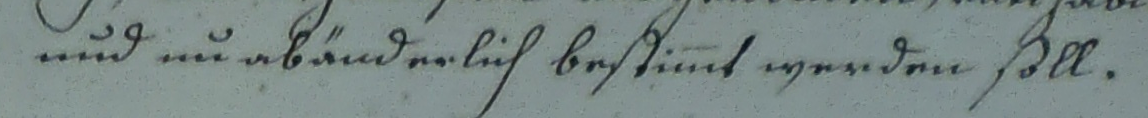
und unabänderlich bestim̅t werden soll.
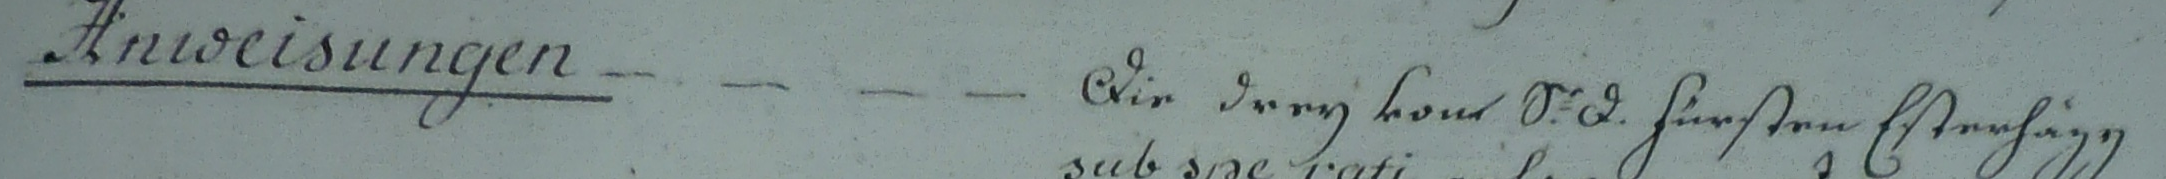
Anweisungen _ _ _ _ Die drey von Se͇ D. Fürsten Esterhàzy
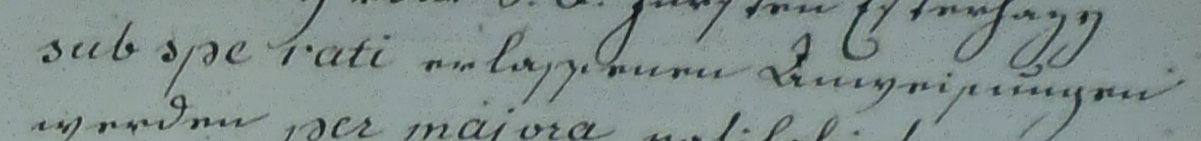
sub spe rati erlassenen Anweisungen
